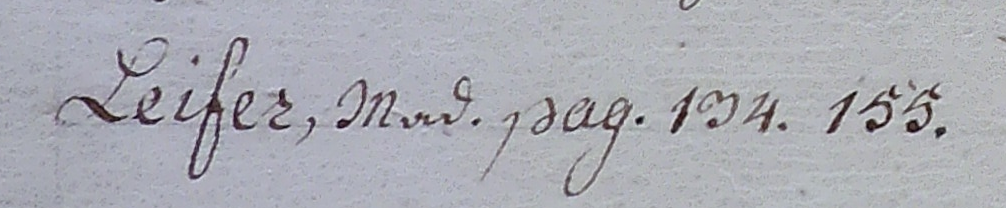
Leifer, Mad. pag. 134. 155.
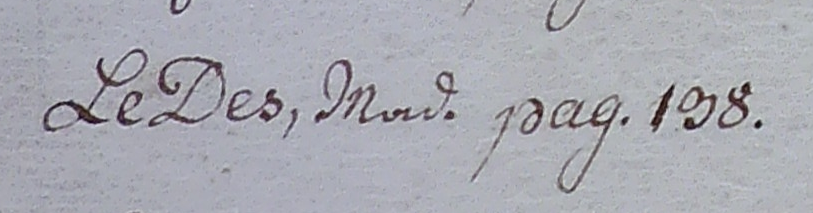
Le Des, Mad. pag. 138.
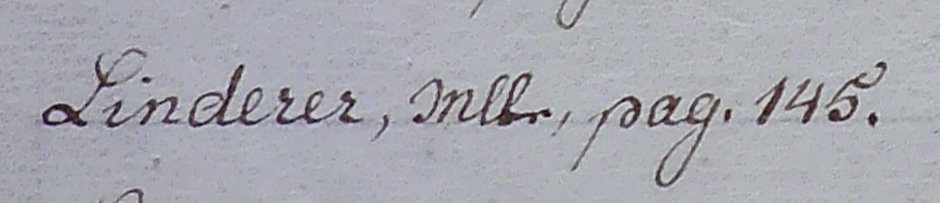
Linderer, Mlle, pag. 145.
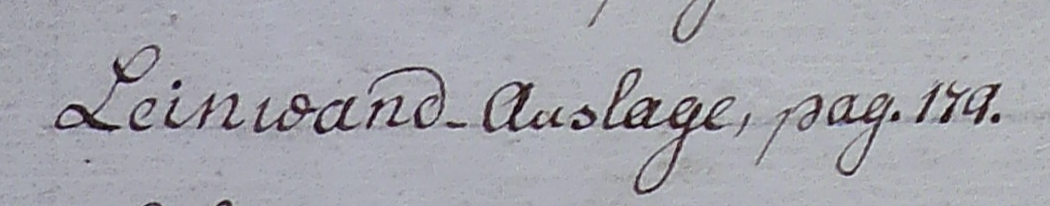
Leinwand_Auslage, pag. 179.
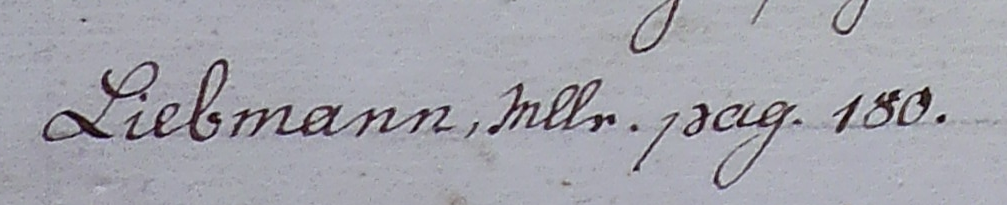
Liebmann, Mlle. pag. 180.
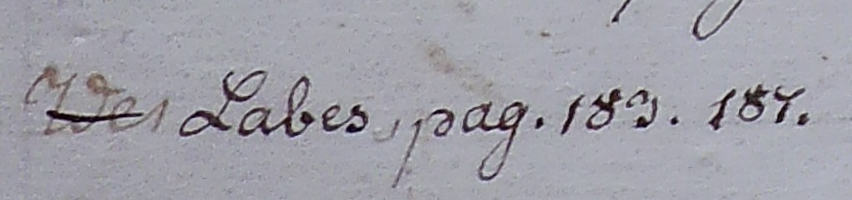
Wes Labes, pag. 183. 187.
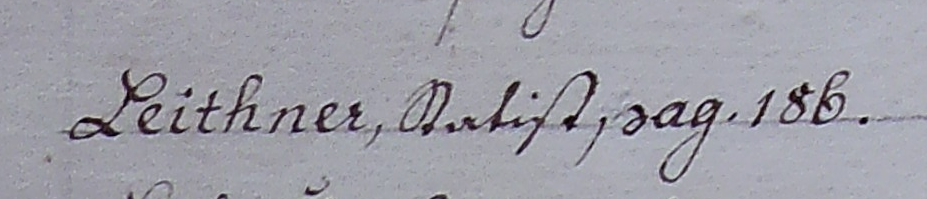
Leithner, Statist, pag. 186.
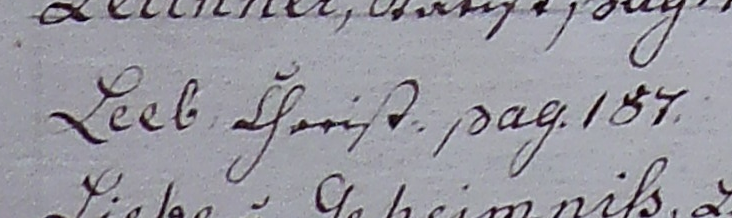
Leeb, Chorist. pag. 187.
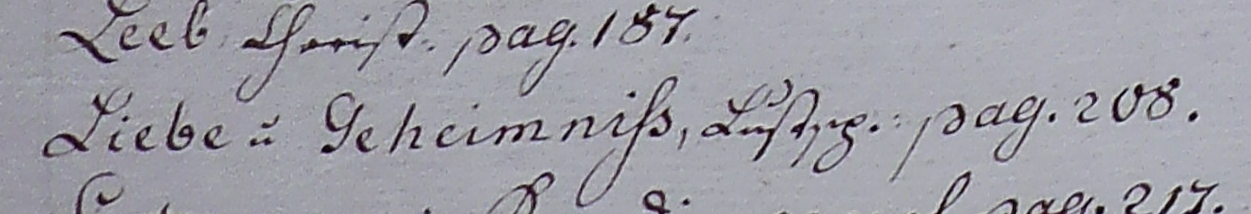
Liebe u Geheimniss, Lustsp. pag. 208.
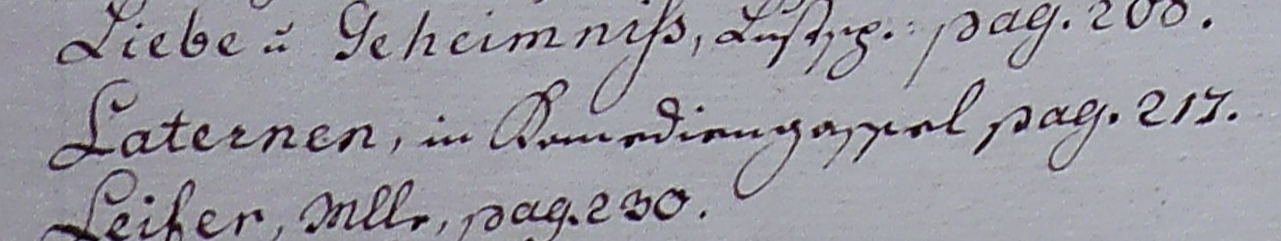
Laternen, in Komediengassel pag. 217.
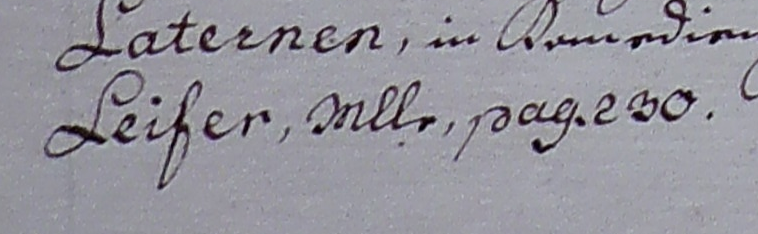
Leifer, Mlle, pag. 230.
